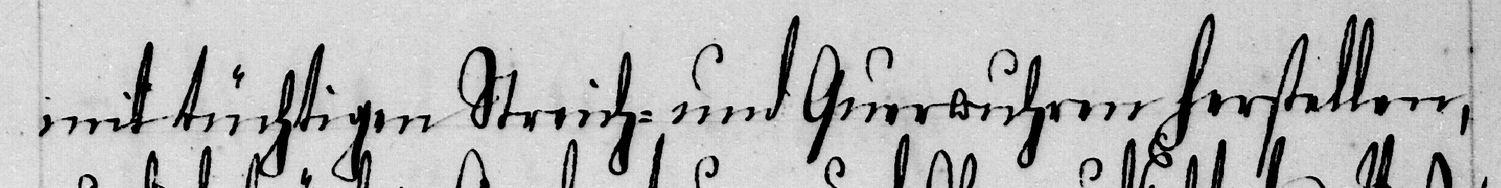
mit tüchtigen Streich- und Querwuhren herstellen,
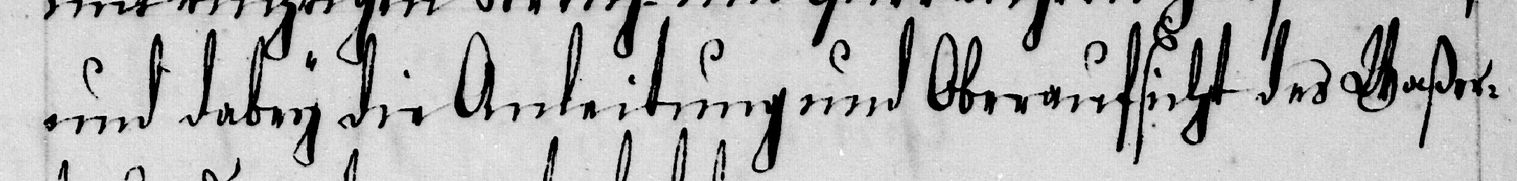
und dabey die Anleitung und Oberaufsicht des Straß¬
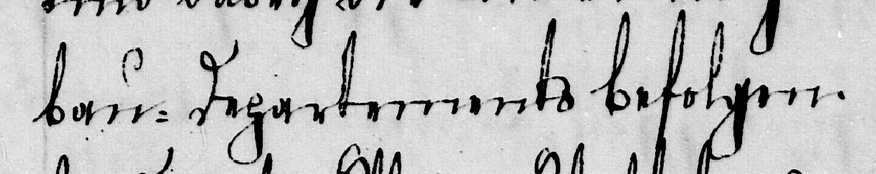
bau-Departements befolgen.
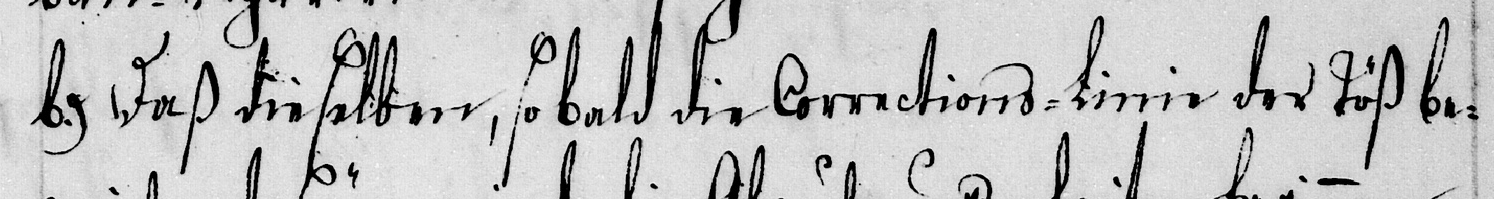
b.) Daß dieselbe, sobald die Corrections-Linie der Töß be¬
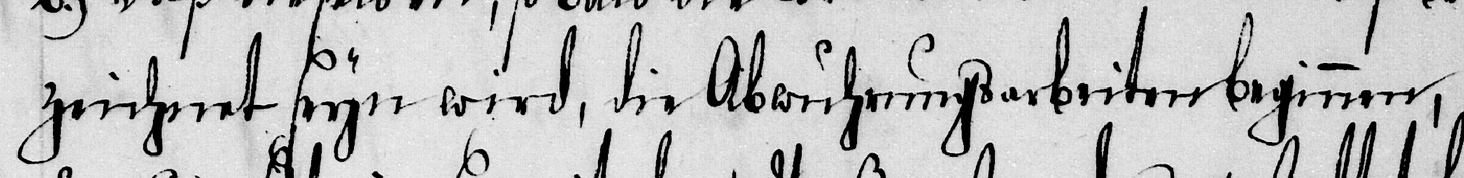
zeichnet seyn wird, die Abwuhrungsarbeiten beginnen,
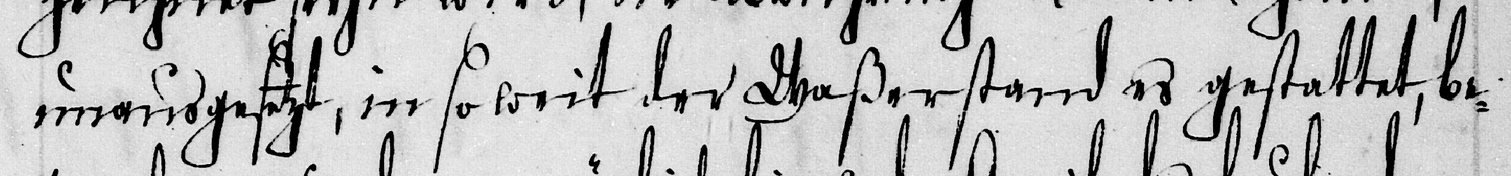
unausgesetzt, insoweit der Waßerstand es gestattet, be¬
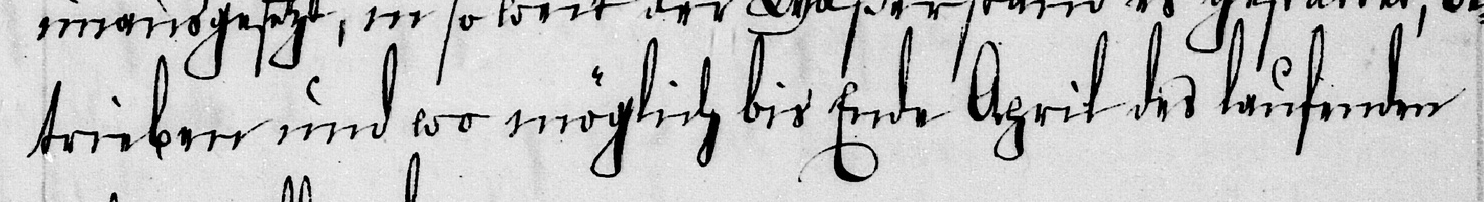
trieben und wo möglich bis Ende April des laufenden
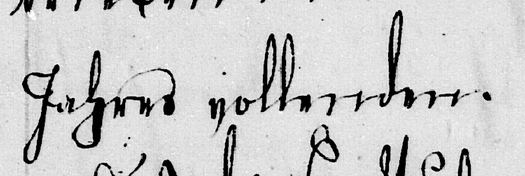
Jahres vollenden.
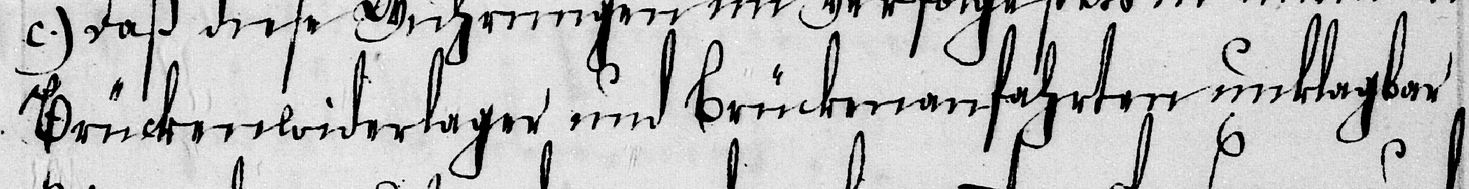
Brückenwiderlager und Brückenanfahrten unklagbar
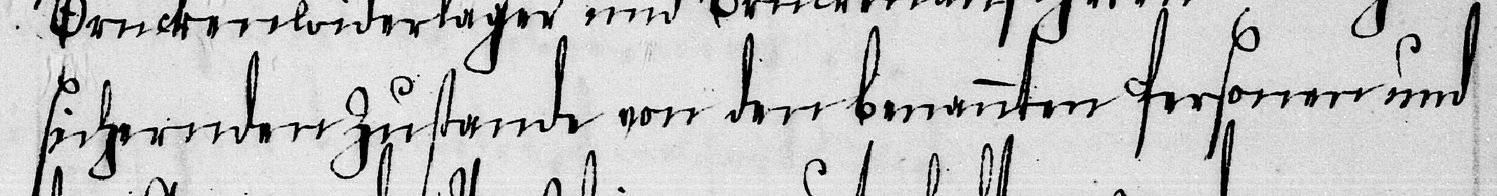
sichernden Zustande von den benannten Personen und
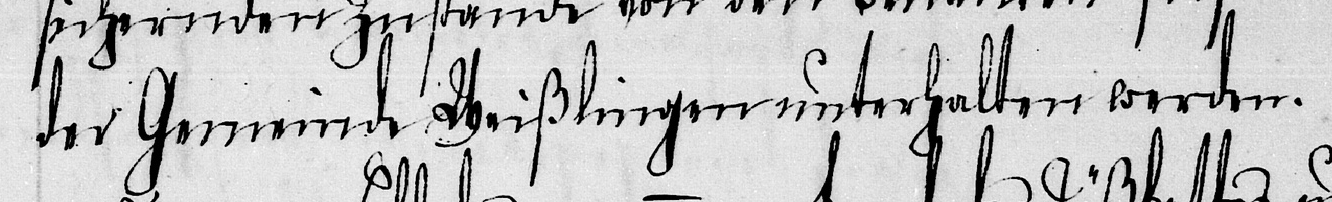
der Gemeinde Weißlingen unterhalten werden.
